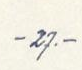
27
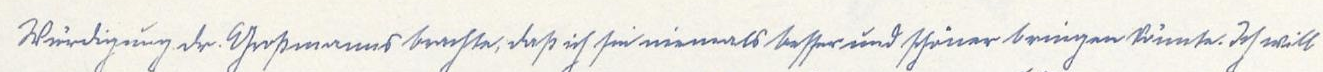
Würdigung Dr. Großmanns brachte, dass ich sie niemals besser und schöner bringen könnte. Ich will
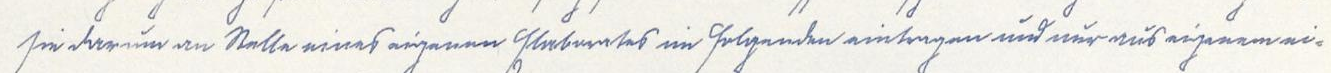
will sie darum an Stelle eines eigenen Elaborates im Folgenden eintragen und nur aus eigenem ei-
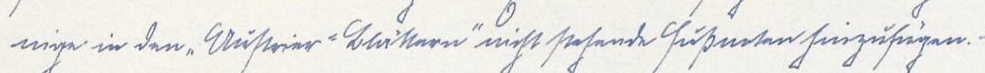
nige in den „Austrier-Blättern“ nicht stehende Fußnoten hinzufügen.-
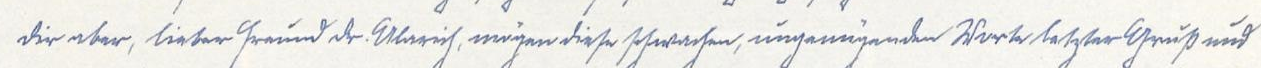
Dir aber, lieber Freund, Dr. Alarich, mögen diese schwachen, ungenügenden Worte letzter Gruß und
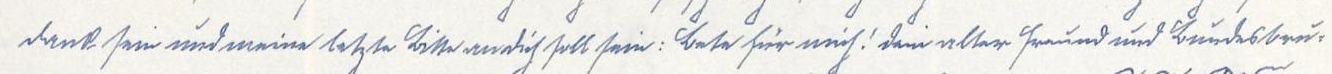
Dank sein und meine letzte Bitte endlich soll sein: Bete für mich! Dein alter Freund und Bundesbru-
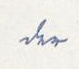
der
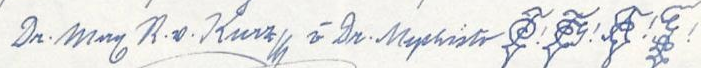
Dr. Max R. v. Kurz, v/o Dr. Mephisto x! x! x! x!
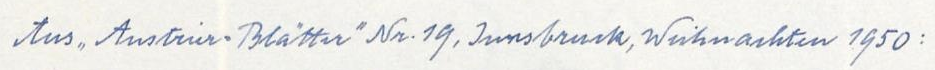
Aus: „Austria-Blätter“ Nr. 19, Innsbruck, Weihnachten 1950:
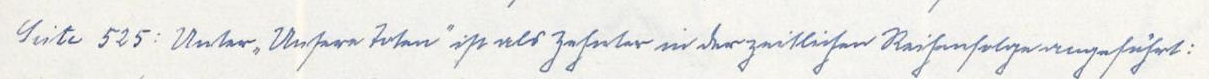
Seite 525: Unter „Unsere Toten“ ist als zehnter in der zeitlichen Reihenfolge angeführt:
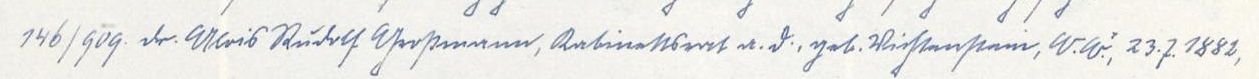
146/909. Dr. Alois Rudolf Großmann, Kabinettsrat a. D., geb. Vichtenstein OÖ, 23. 7. 1882,
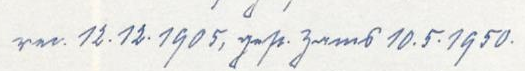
rez. 12. 12. 1905, gest. Zams 10.5.1950.
